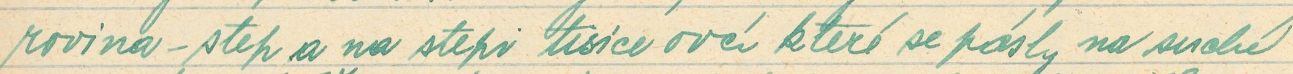rovina - step a na stepi tisíce ovcí které se pásly na suché
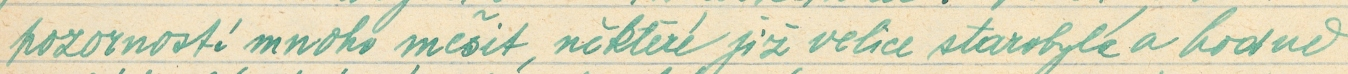pozorností mnoho mešit, některé již velice starobylé a hodně
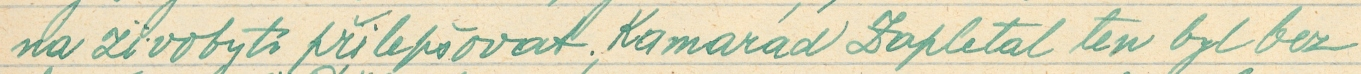na živobytí přilepšovat. Kamarád Zapletal ten byl bez
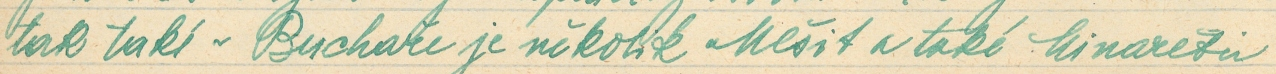tak také v Buchaře je několik Mešit a také Minaretů
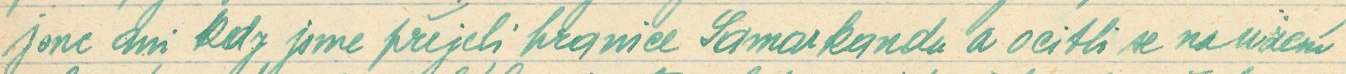jsme ani kdy jsme přejeli hranice Samarkandu a ocitli se na území
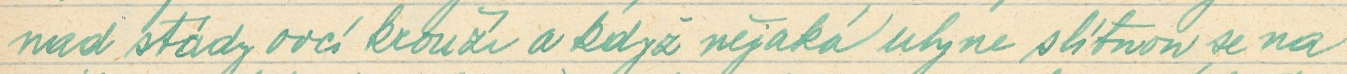nad stády ovcí krouží a když nějaká uhyne slítnou se na
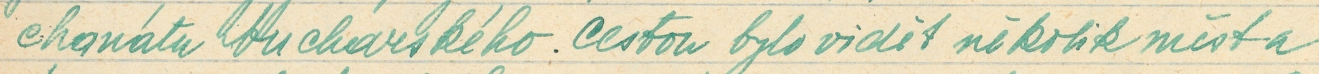chanátu bucharského. Cestou bylo vidět několik měst a
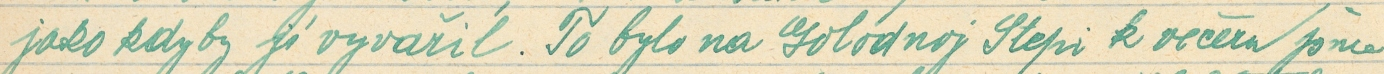jako kdyby ji vyvařil. To bylo na Golodnoj Stepi k večeru jsme
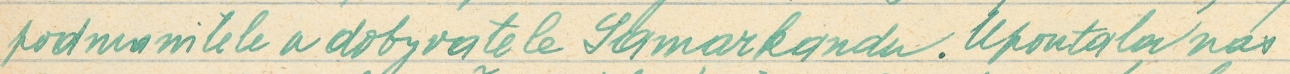podmanitele a dobyvatele Samarkandu. Upoutala nás
